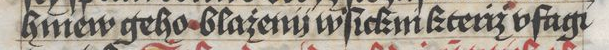hniew geho.blażenij wẛickni kteṙiż ufagi
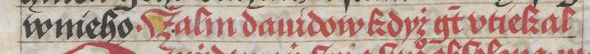wnieho.Żalm davidow když ḡt utiekal
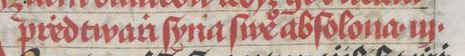předtwaṙi ſyna ſweo abſolona.iii.
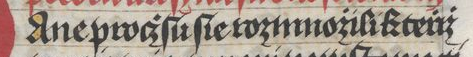Ae proſ ſu ſe rozmnożili kteṙiż
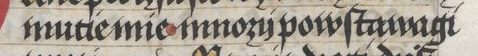nutie mie.mnozij powſtawagí
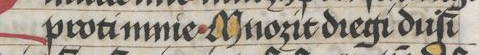proti mnie.Mnozít diegí duẛi
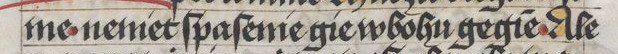me.neniet ſpaſeníe gíe wbohu gegiē.Ale
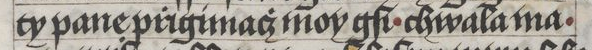ty pane pṙigimacż moy gſi.chwala ma.
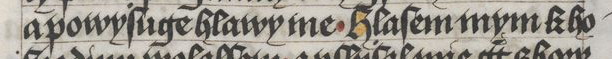a powyẛuge hlawy me.Hlaſem mym k ho¬
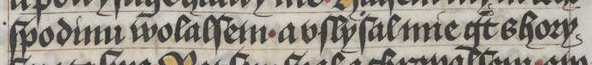ſpodinu wolalſem.a uſlyẛal mie ḡt shory
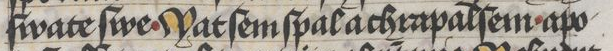ſwate ſwe.Yatſem ſpal a chrapalſem.a po¬
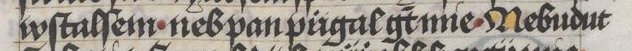wſtalſem.neb pan pṙigal ḡt mie.Nebudut
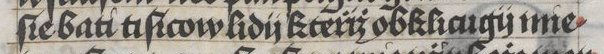ſie bati tiſicow lidij kteṙiž obklicugij mie.
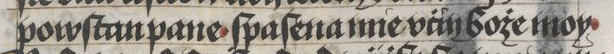powſtan pane.ſpaſena mie uċin boże moy.
